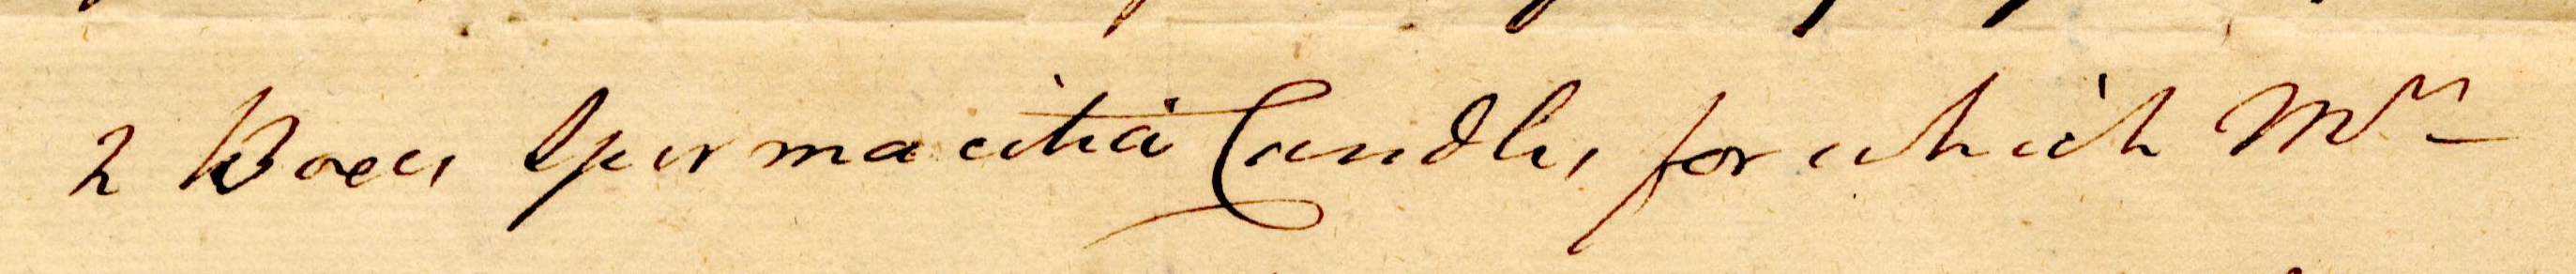2 Boxes, your macitia Candle, for which M^r
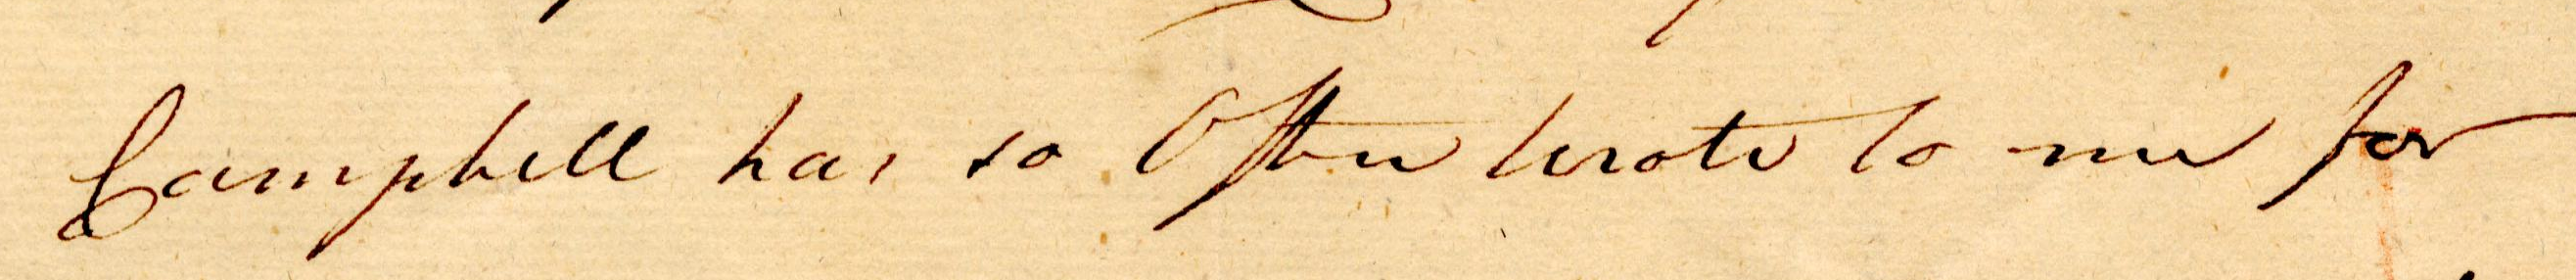Campbell has so Often wrote to me for
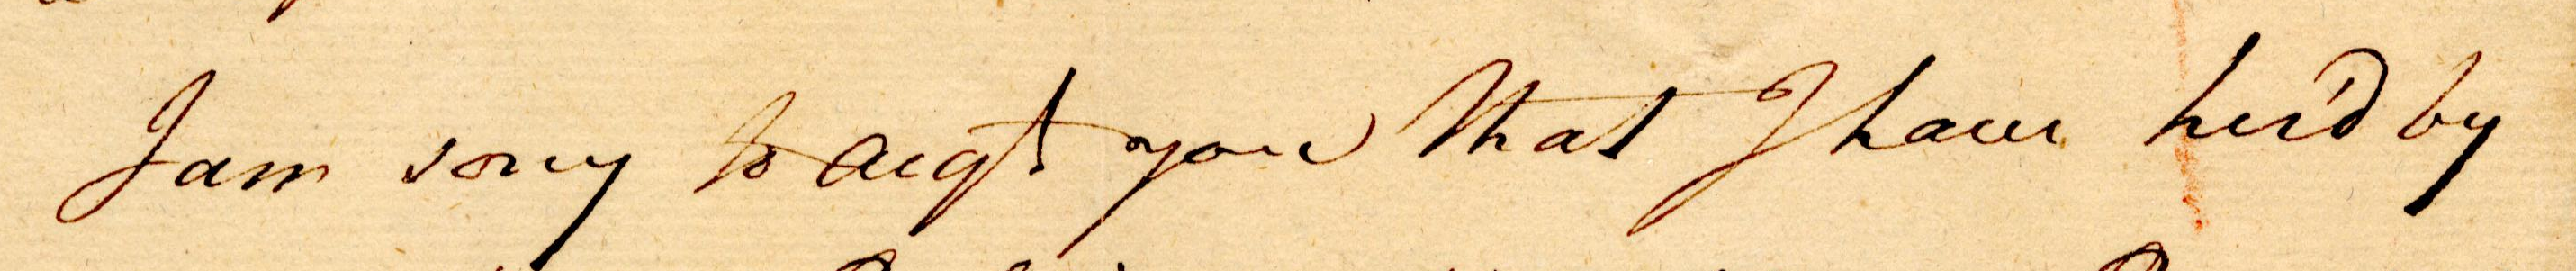I am sorry to acq^t. you that I have her'd by
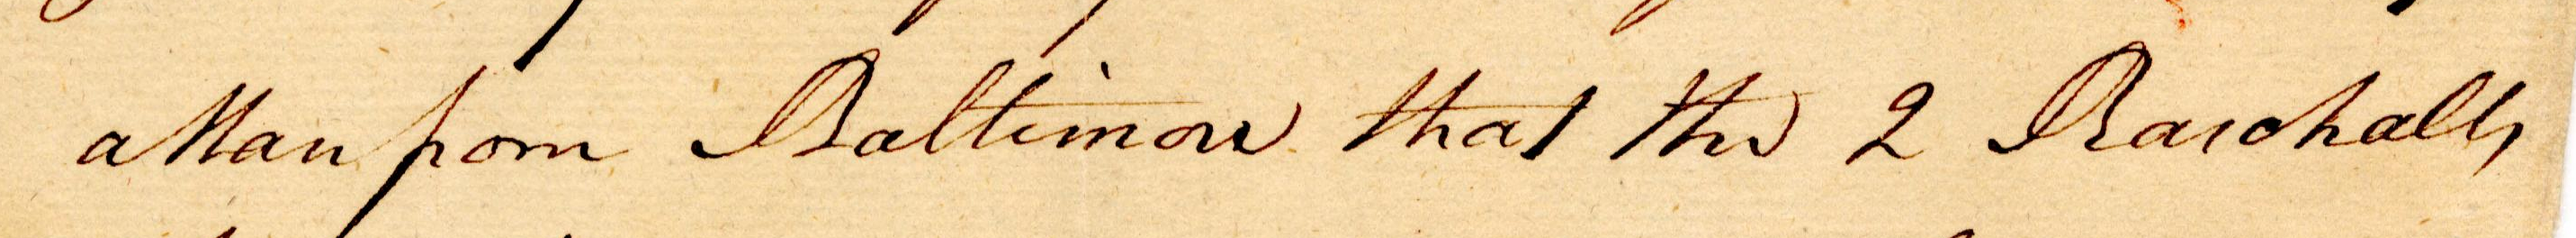a Man from Baltimore that the 2 Raschalls
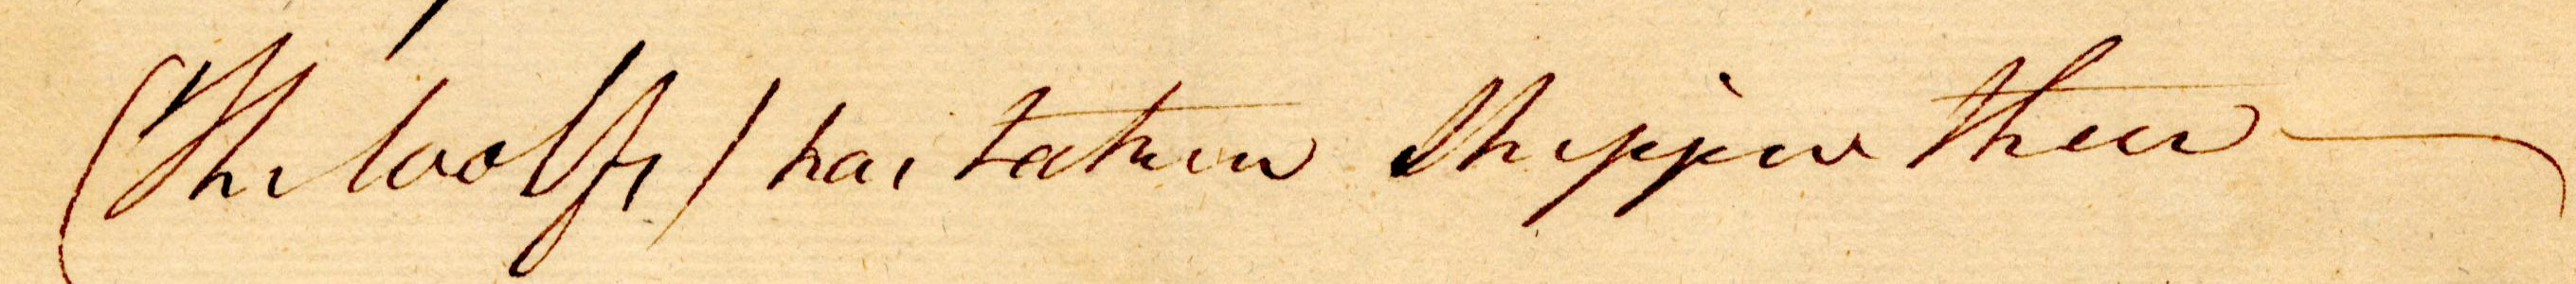(the loalfs) has taken Shippen there.-
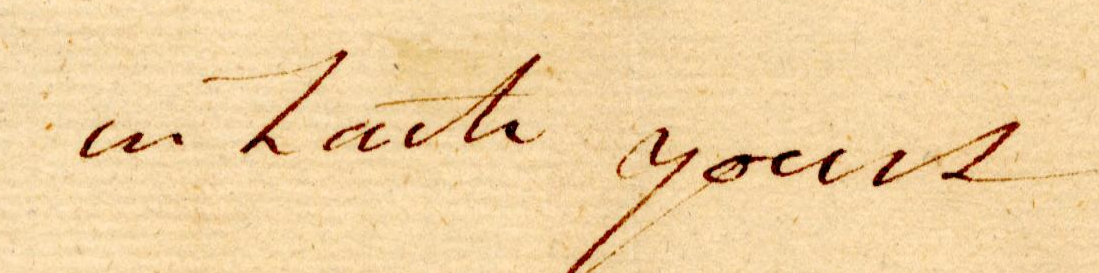in haste yours
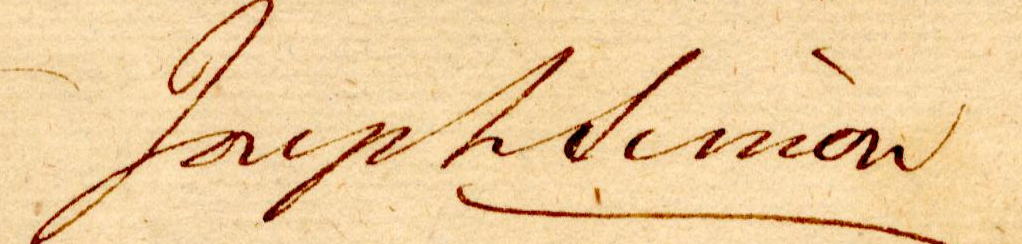Joseph Simon
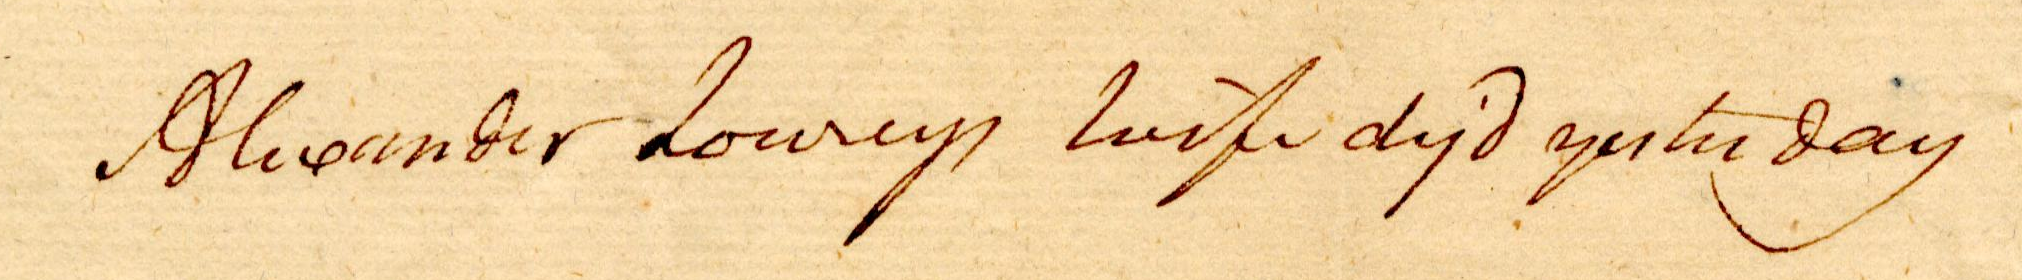Alexander Lowrys wife dy'd yeserday
